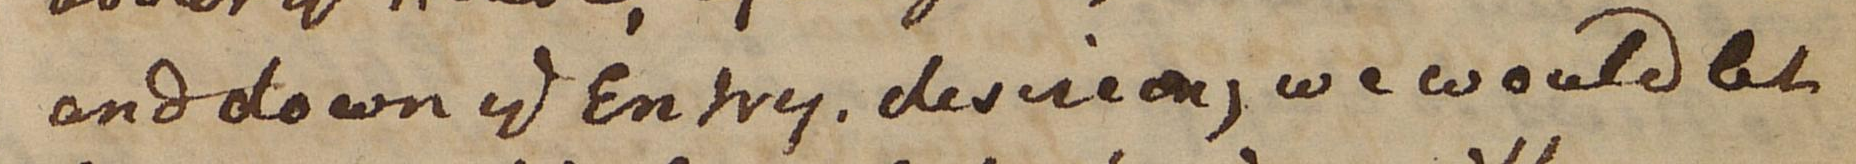and down y^e Entry. desireng? we would let
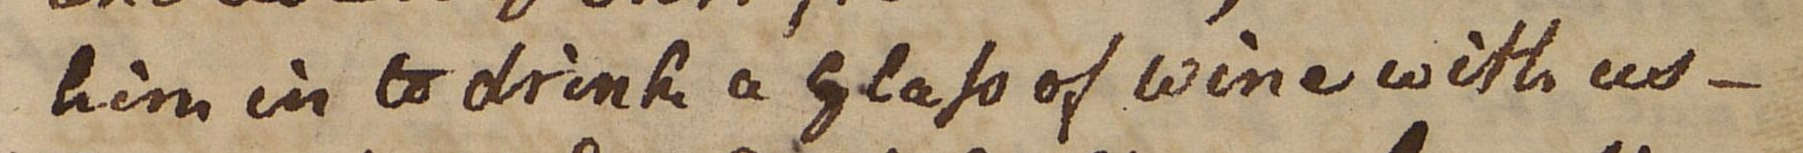him in to drink a Glass of wine with us -
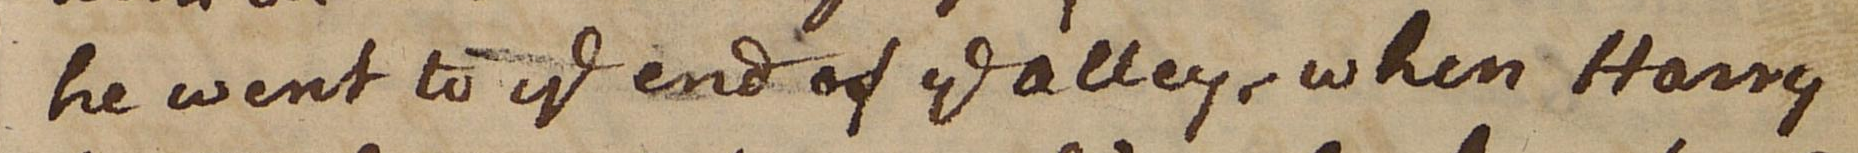he went to y^e end of y^e alley. when Harry
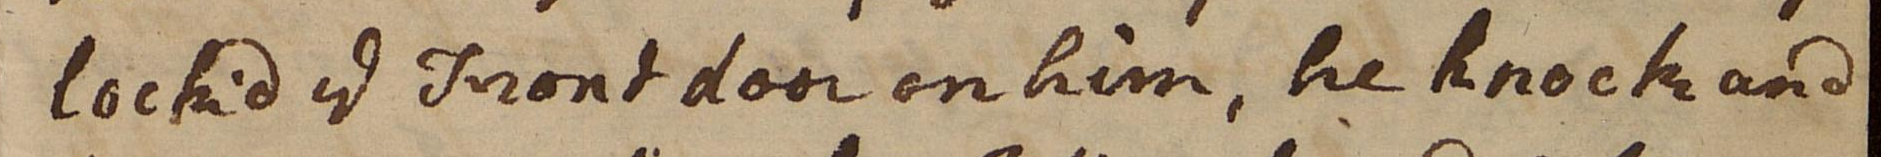lock'd y^e Front door on him, he knock and
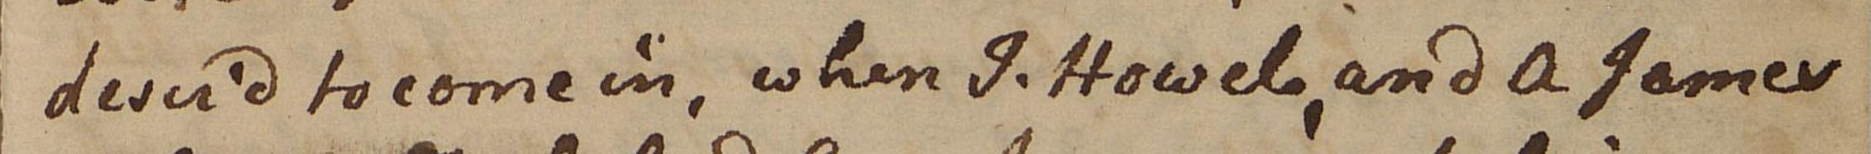desir'd to come in, when J. Howel, and James
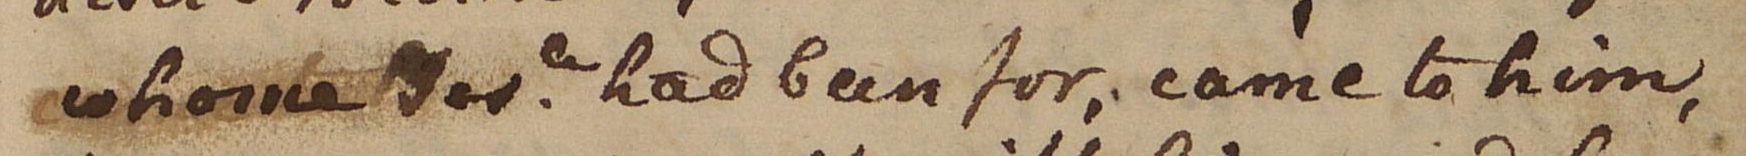whome Jos^a. had been for, came to him,
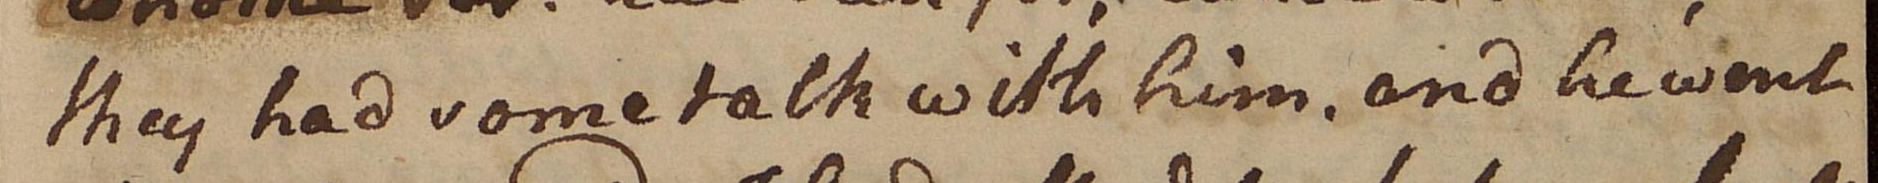they had some talk with him, and he went
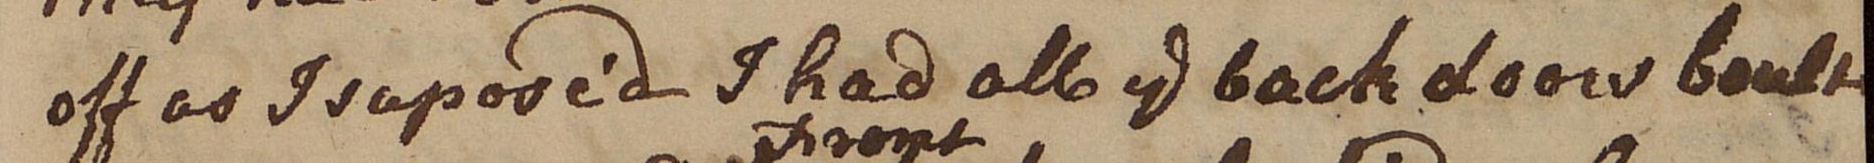off as I supose'd- I had all y^e back doors boult
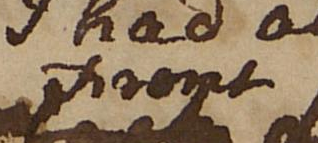Front
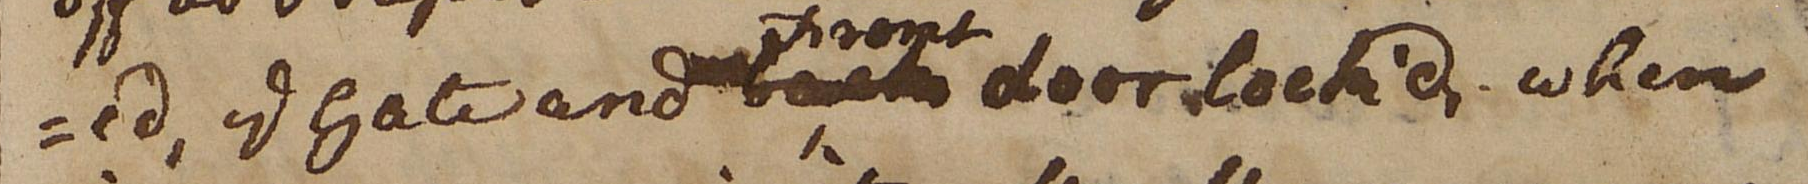-ed, y^e Gate and [back] ^ door lock'd, when
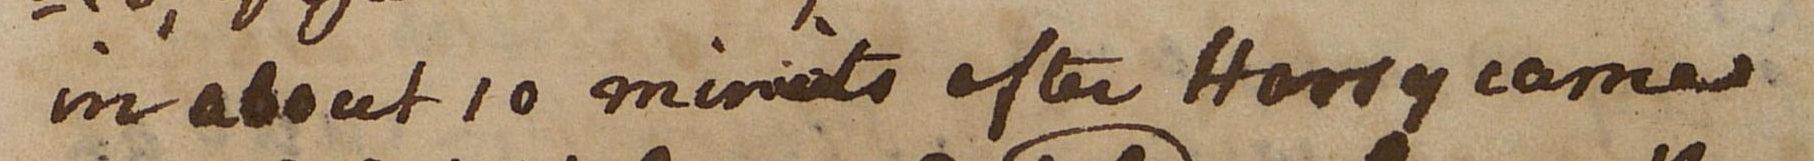in about 10 minuts after Harry came.
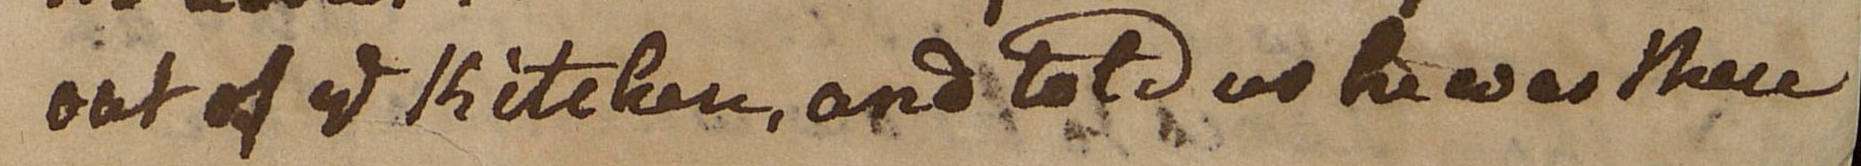out of y^e Kitchen, and told us he was there
